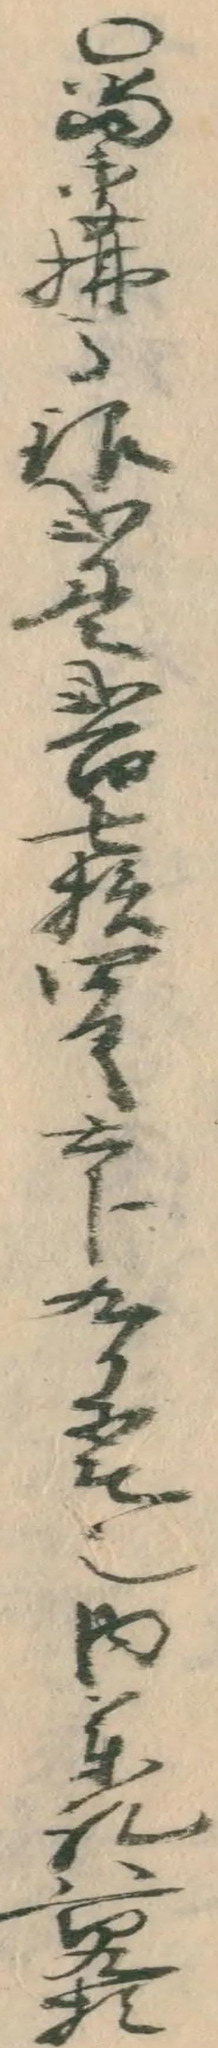○当季払高銀弐貫弐百七拾四匁六分九り五毛也内東礼八百九拾九匁
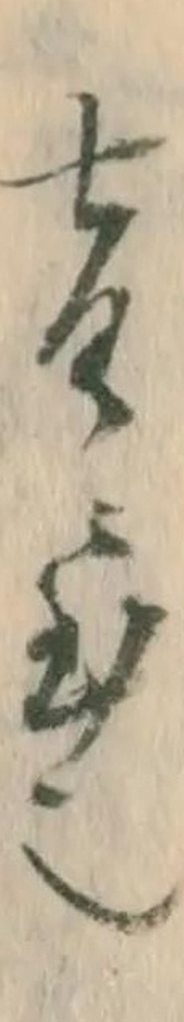七匁に至也

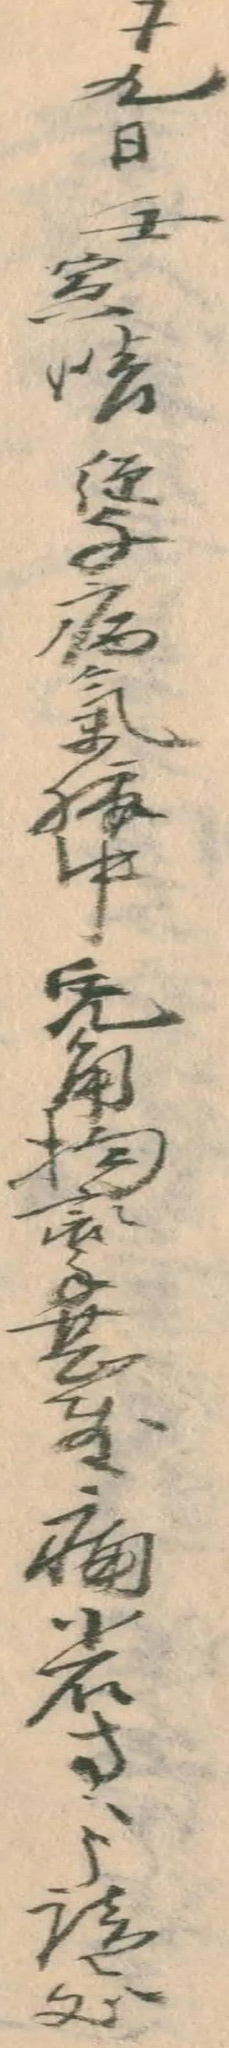十九日壬寅晴経千病気腹中兎角拘攣甚敷痛小石方へ申談候処
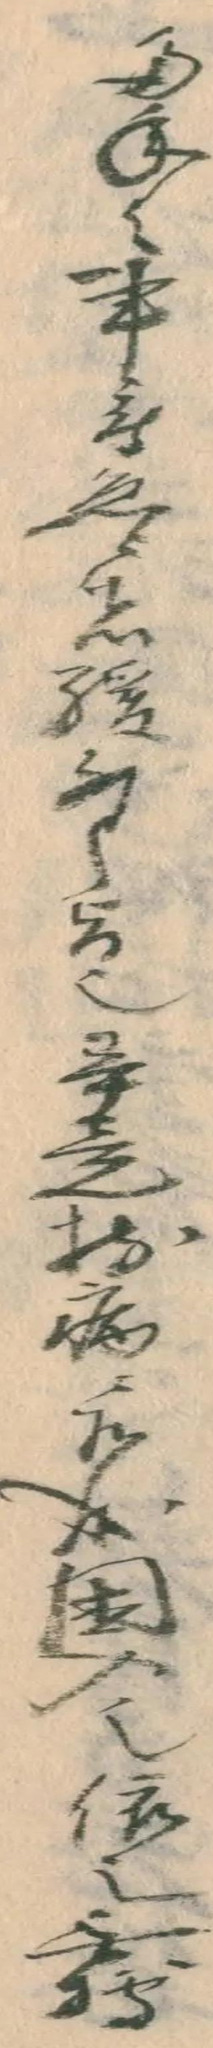多年之事ニ付急ニは緩不申旨也畢竟持病ニ相成困入也依之無拠
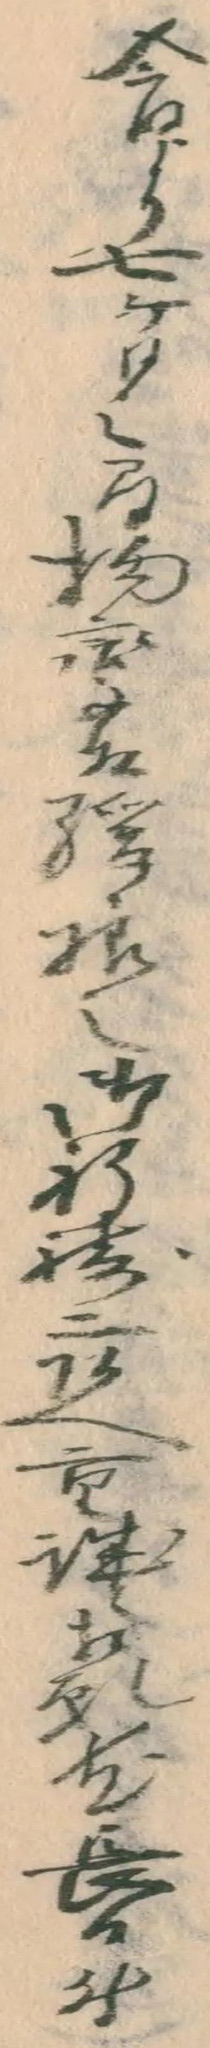今日より七ヶ日之間物拘攣相緩様也御祈祷二頭人重誠ヘ相願尤長日付
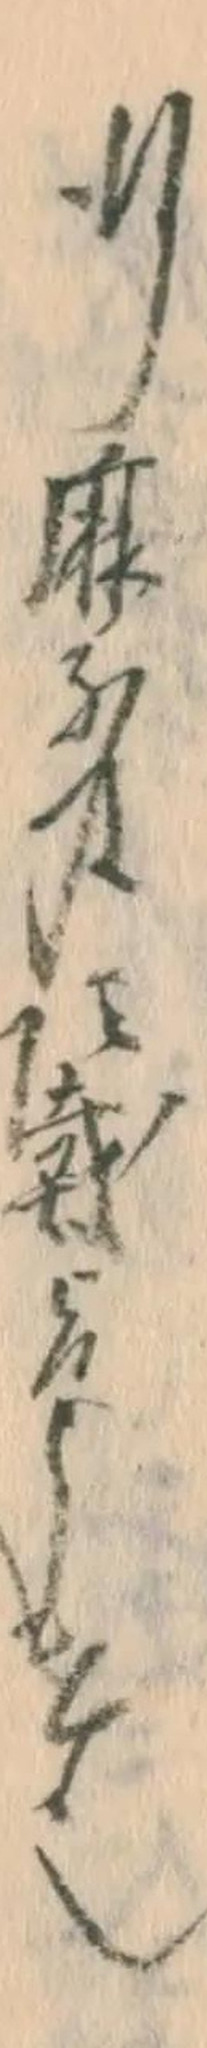行麻不及頂戴旨被申遣也
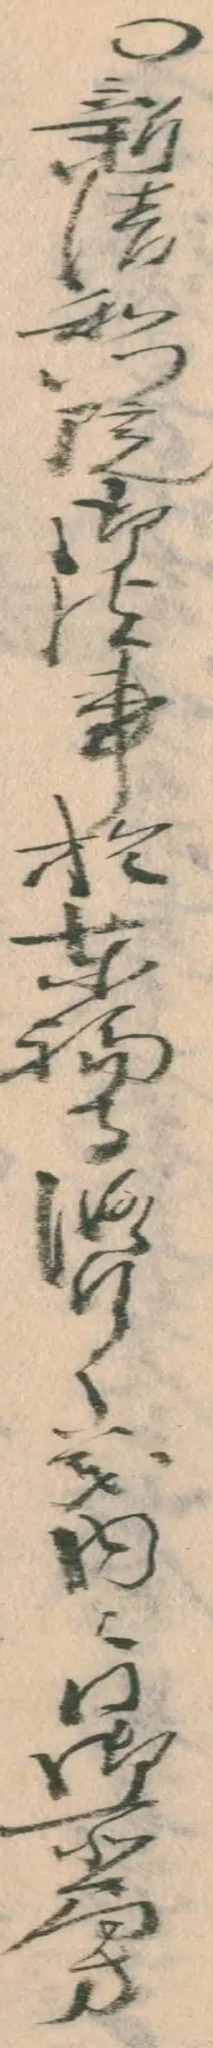○新清和門院御法事於東福寺修行之義内々同御所向方
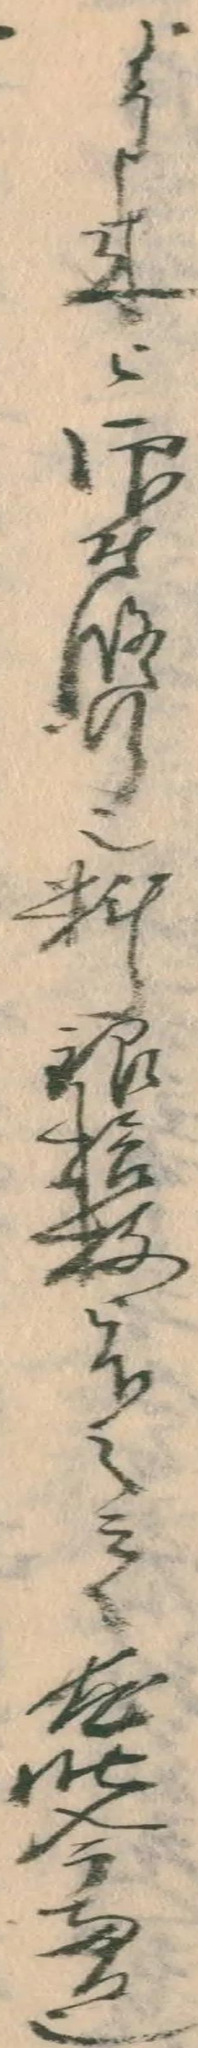より申来被仰付修行也料銀拾枚被下也云々尤昨今両日也
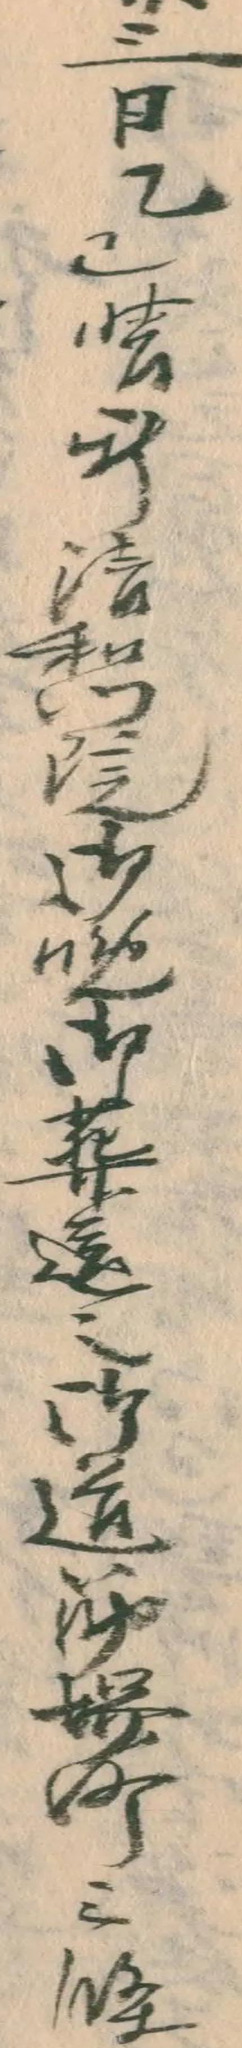廿三日乙巳晴新清和門院御晩御葬送也御道筋堺町三條
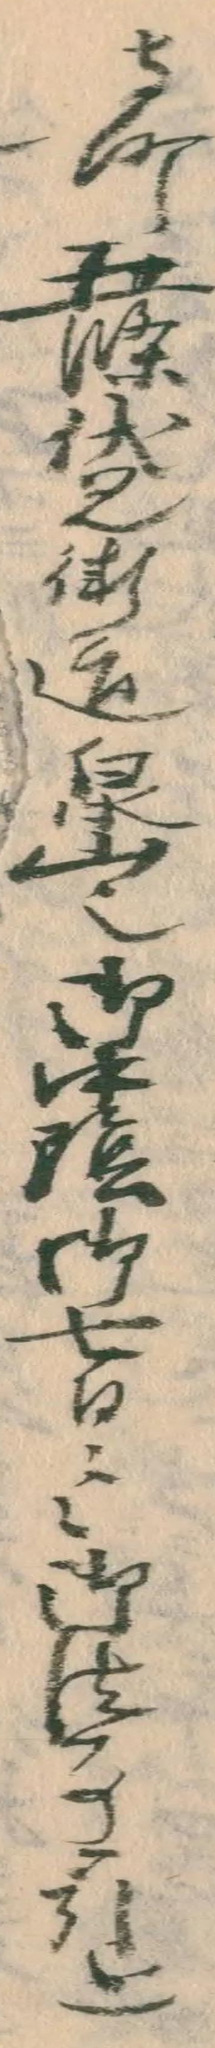寺町五條伏見街道泉山也御中陰御七日云々御法事引上
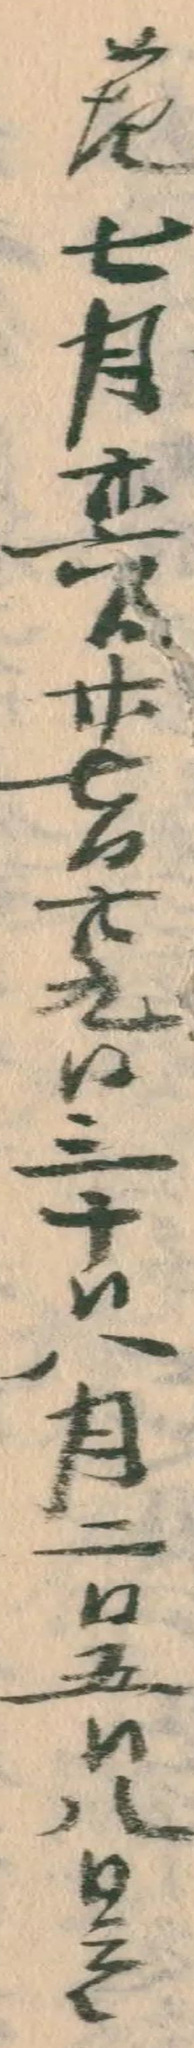如左七月廿六日廿七日廿九日三十日八月二日五日八日云々
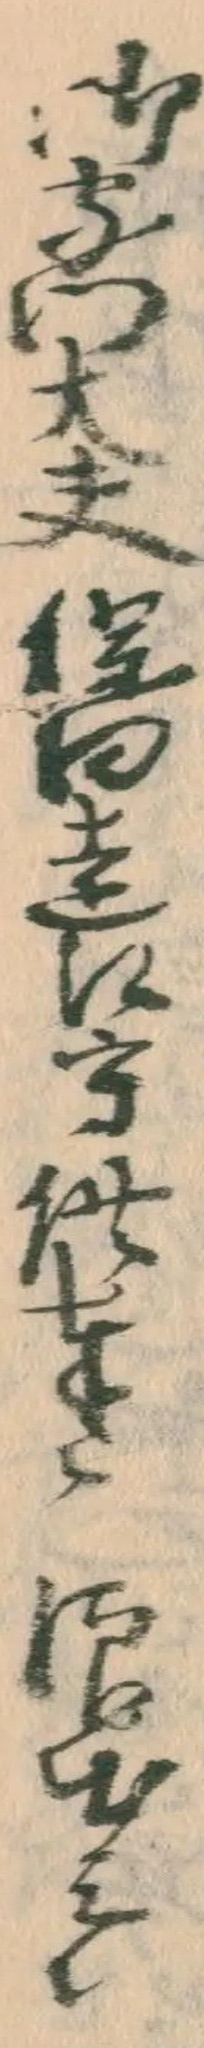御家門大夫保田遠江守供奉被仰出云々
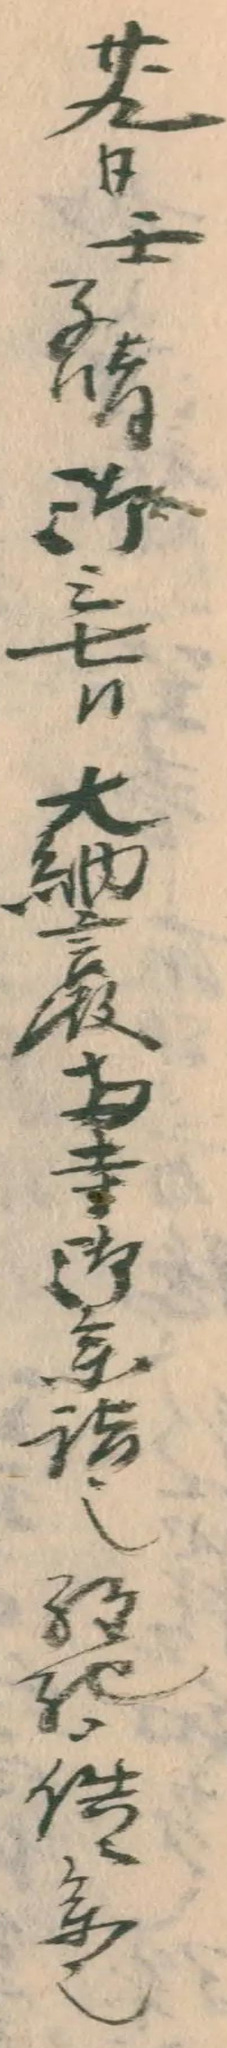廿九日壬子晴御三七日大納言殿両寺御参詣也経紀御供ニ参也
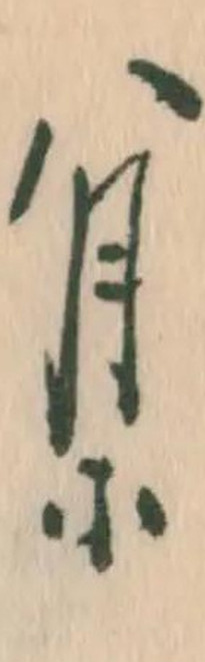八月小
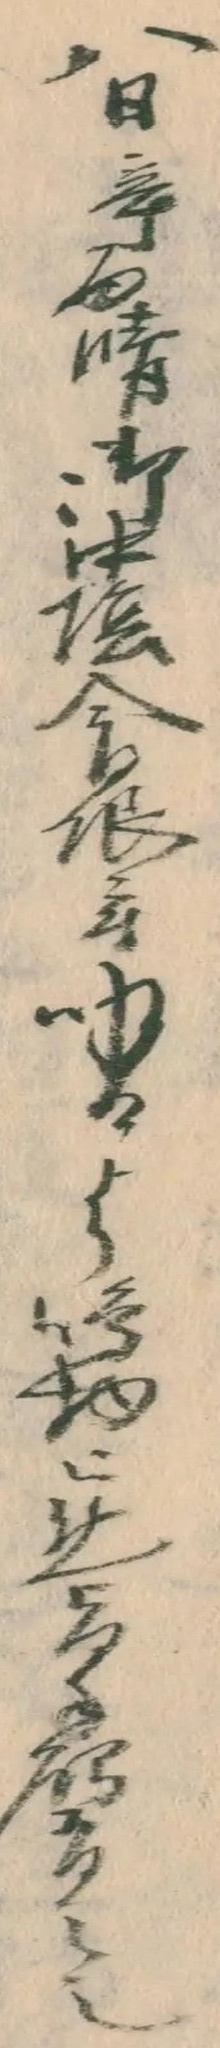八日辛酉晴御中陰今日限ニ付明日より鳴物被免旨手觸有之也
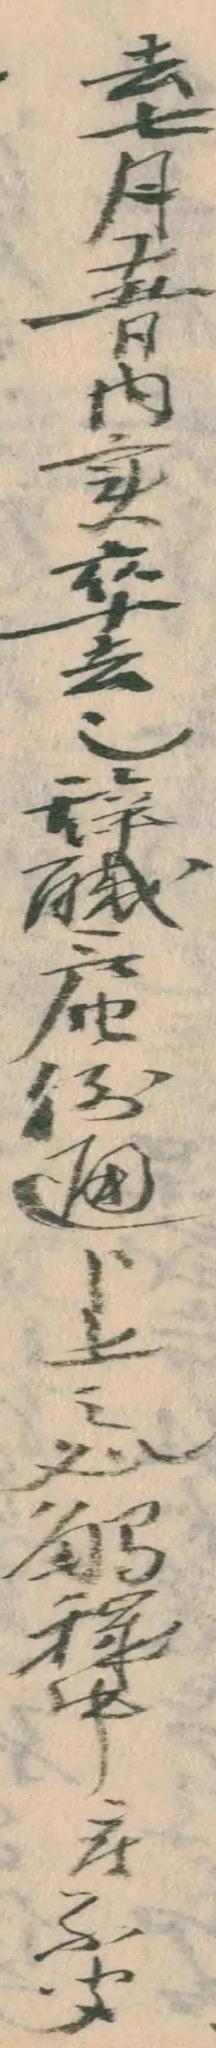去七月十五日内実卒去也辞職御届例通申上之処触穢中ニ付不聞
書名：賀茂社記録. 第70冊
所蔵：国立国会図書館 National Diet Library, JAPAN
